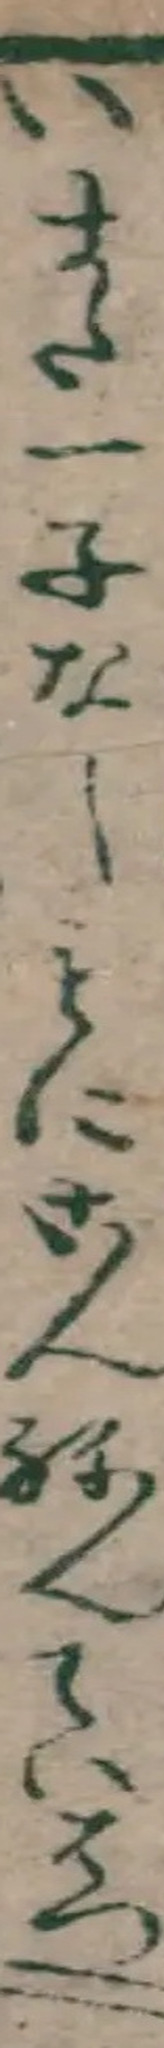いまた一子なしことにこんねんていはつ
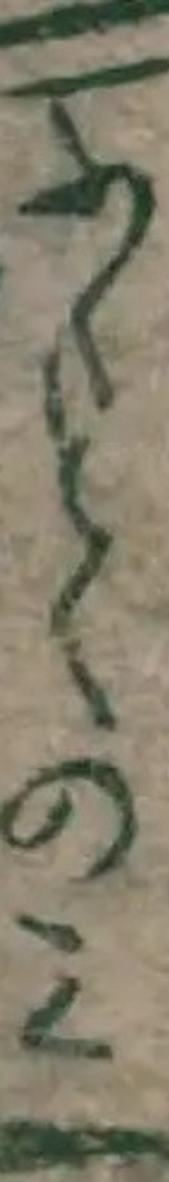ふくとくの三
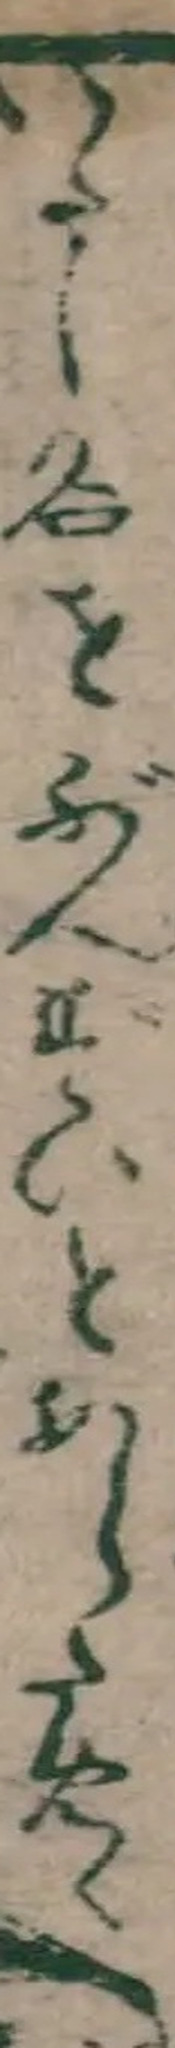いたし名をぶんずいとあらためゝ
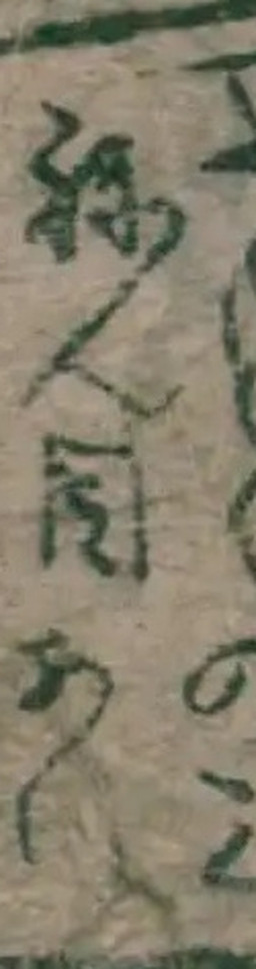ねん目あい
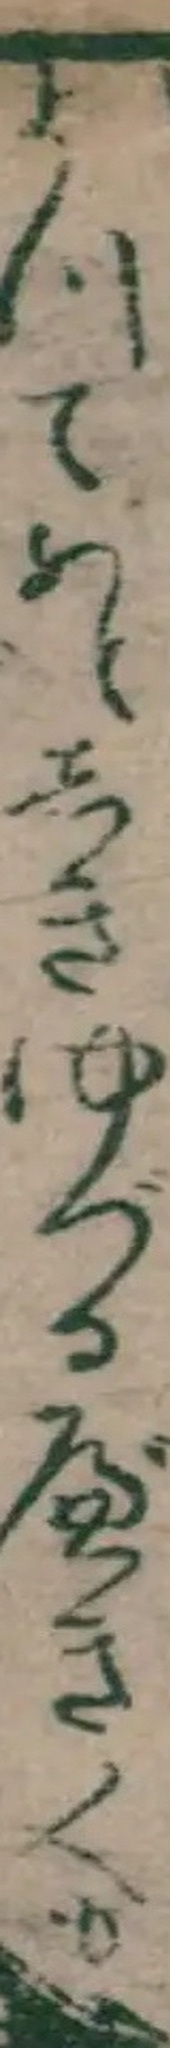とつてあとしきゆづるべき人も
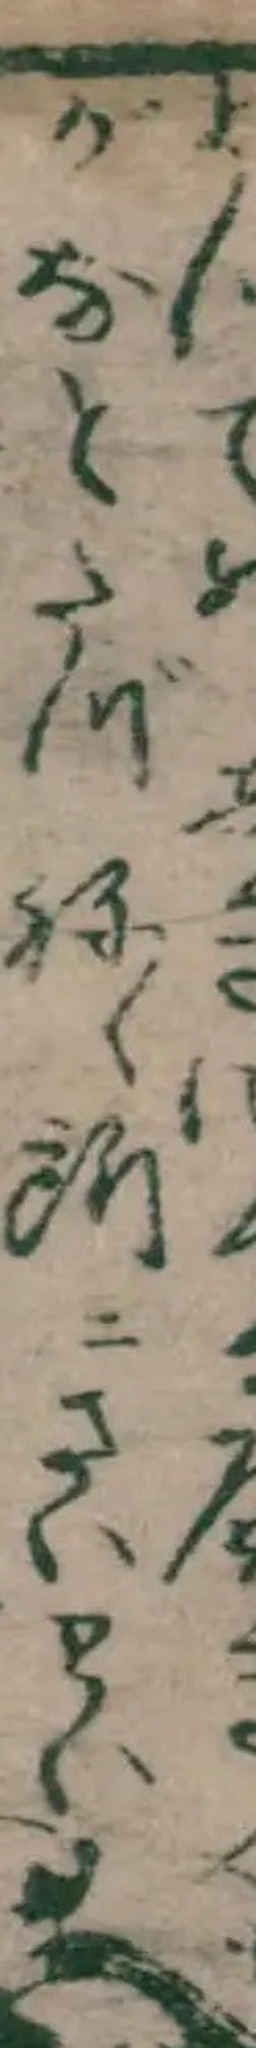がなとたづね〳〵所にさいわい
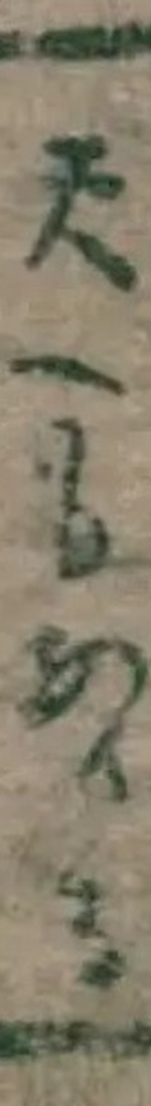天へもあかる
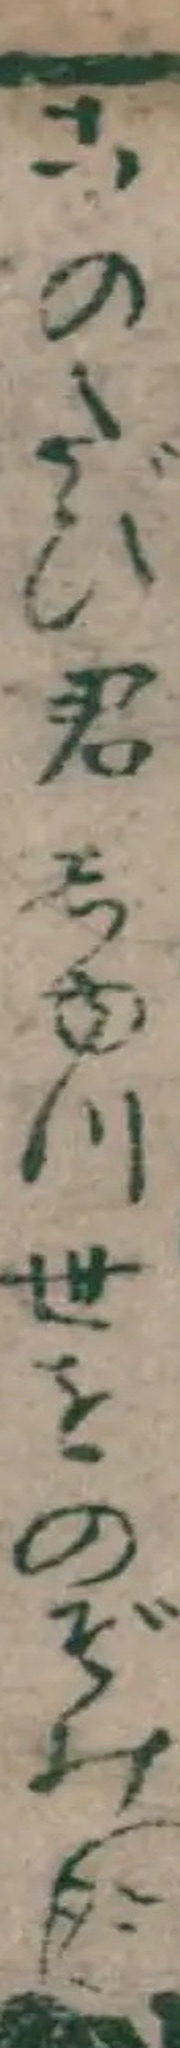このたび君しゆつ世をのぞみ
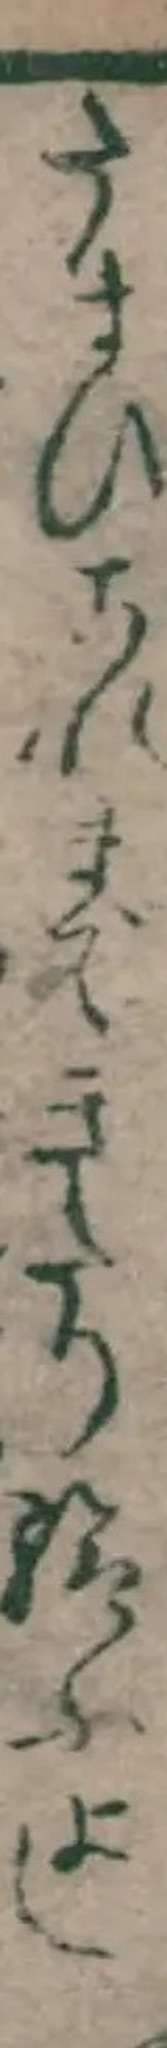たまひこれまできたり給ふよし
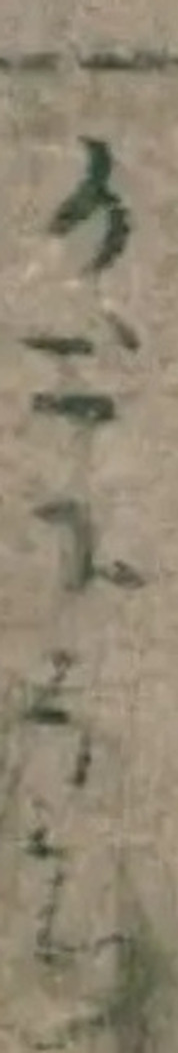かごにうち
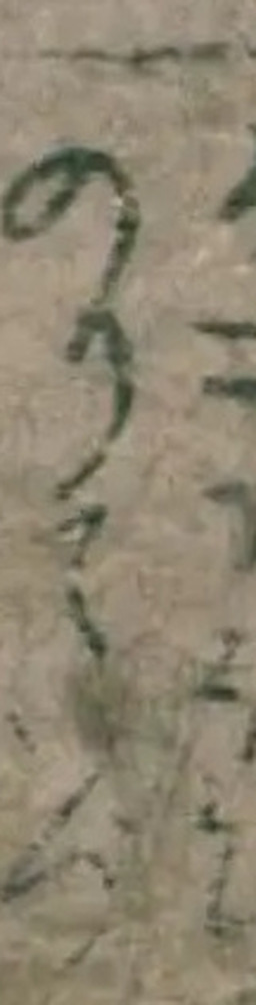のりていづ
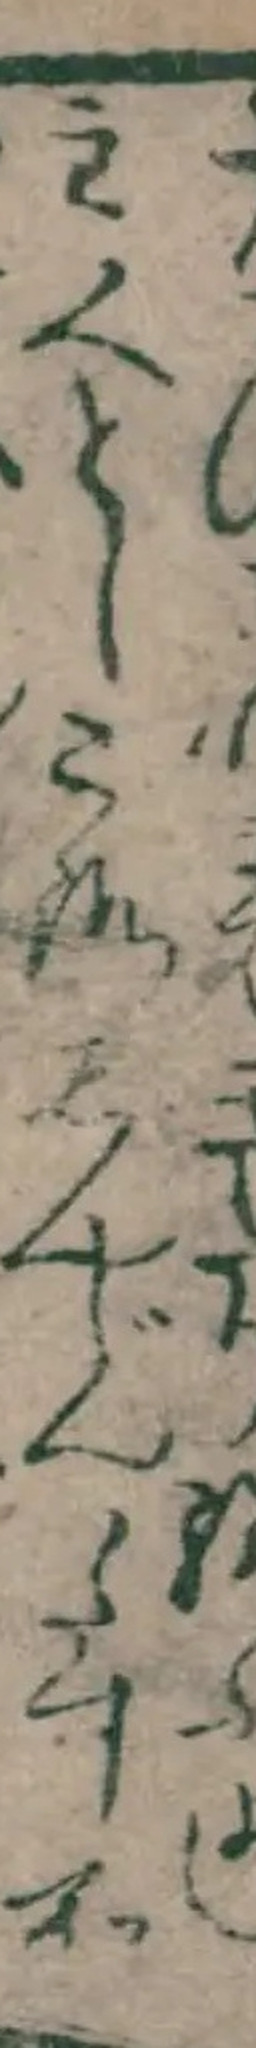主人としころしんじんいたす所
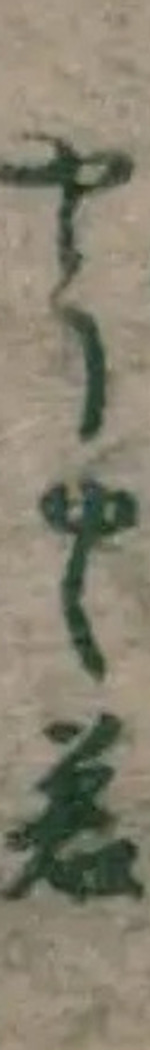やうやく若
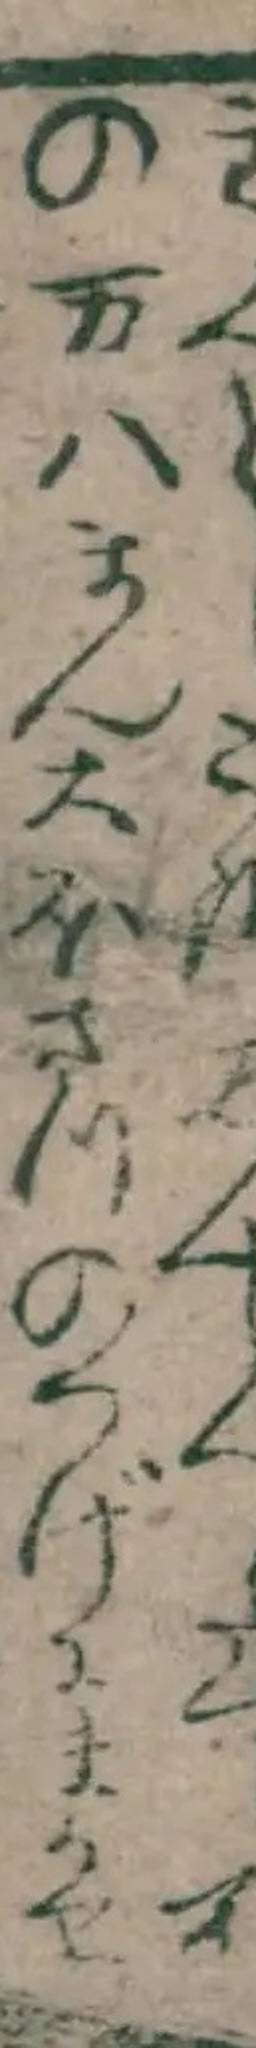の万八まん大ほさつのかげにまかせ
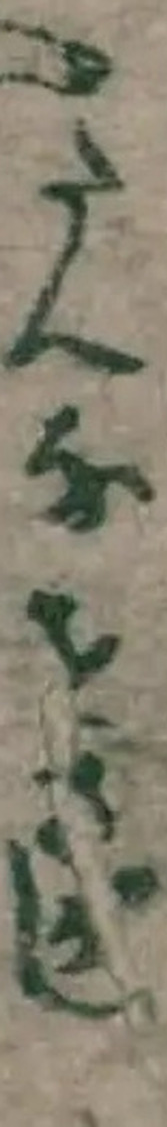たんなをさがし
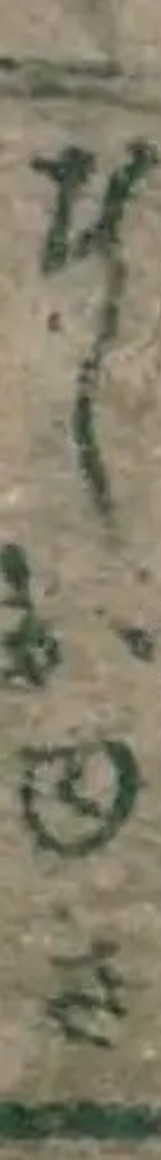なく出ゆき
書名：金々先生栄花夢 : 2巻
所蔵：国立国会図書館 National Diet Library, JAPAN
